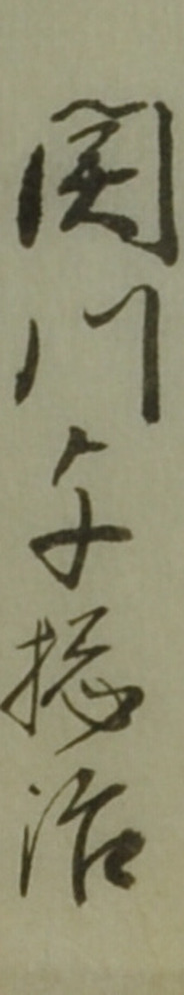関川与総治
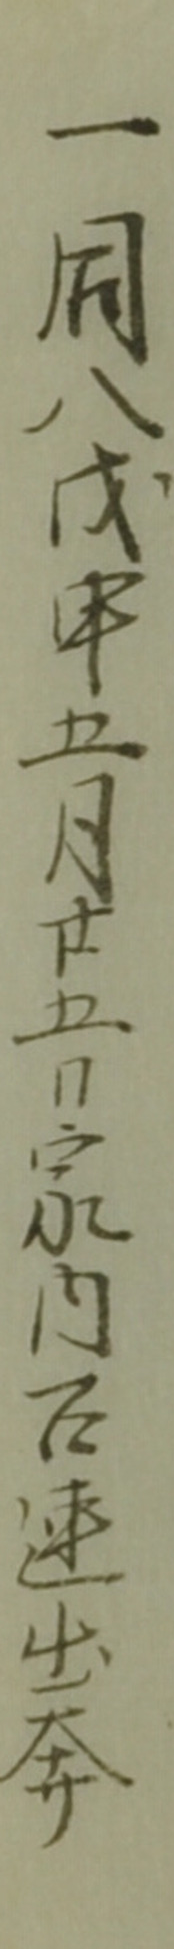一同八戊申五月廿五日家内召連出奔
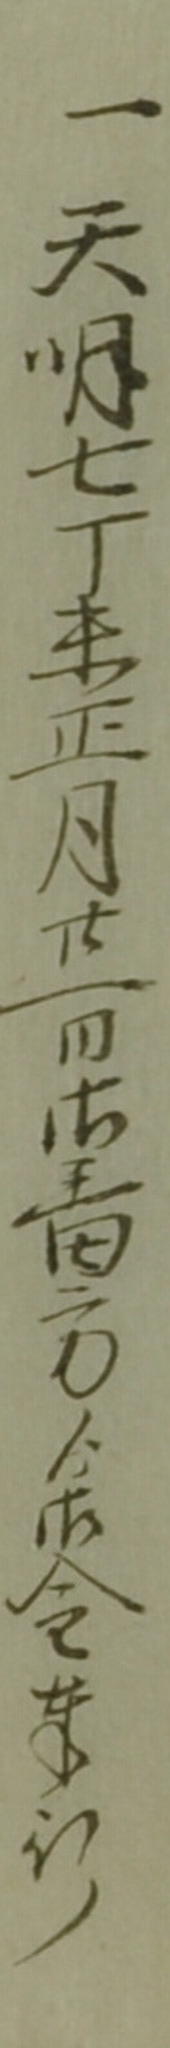一天明七丁未正月廿一日御番方ゟ御金奉行

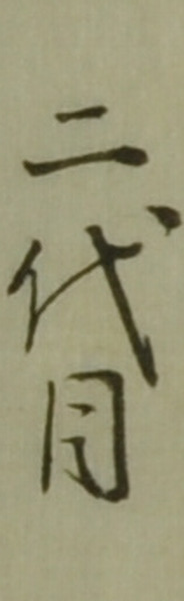二代目
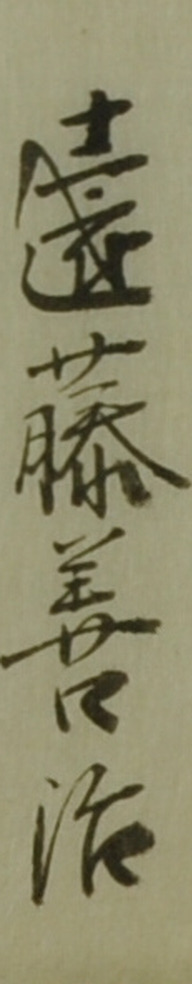遠藤善治
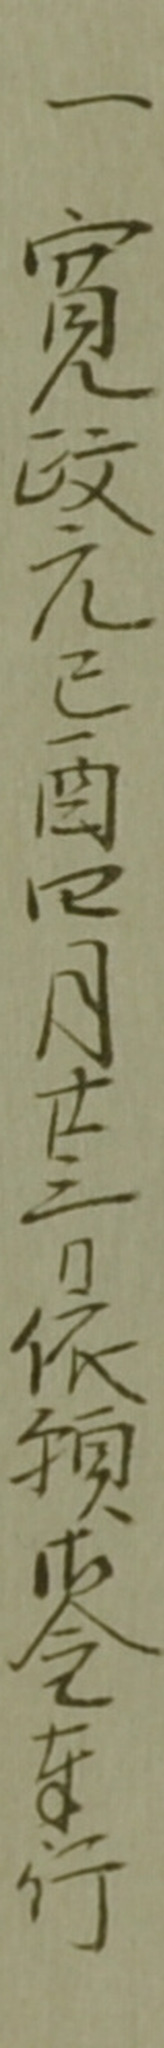一寛政元己酉四月廿三日依願御金奉行
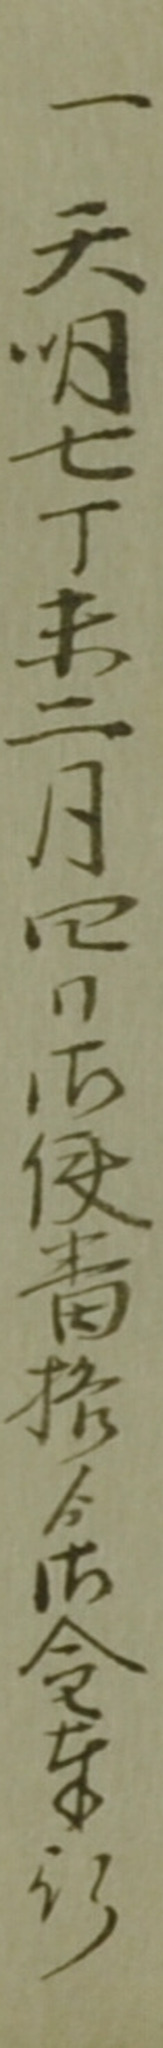一天明七丁未二月四日御使番格ゟ御金奉行
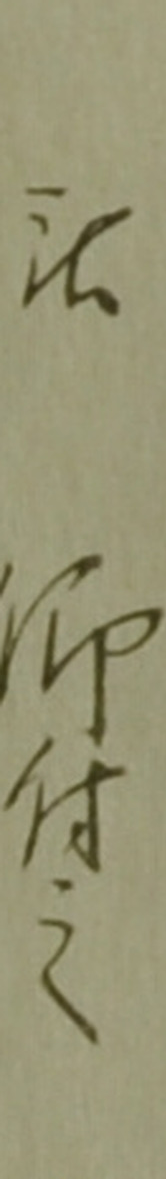被仰付之
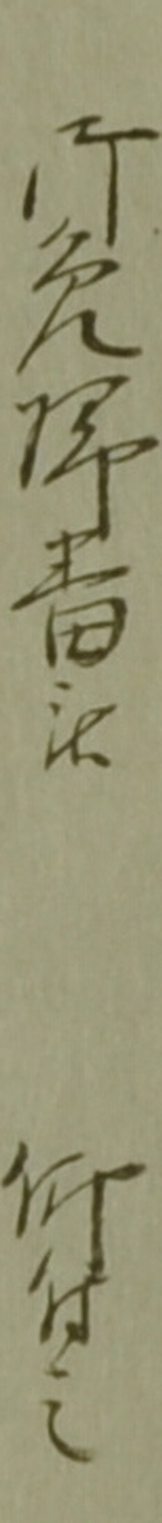御免帰番被仰付之
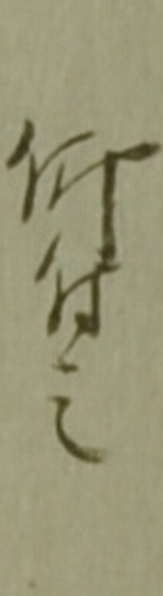仰付之
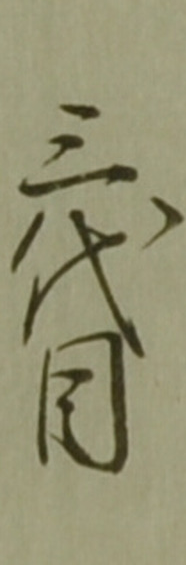三代目
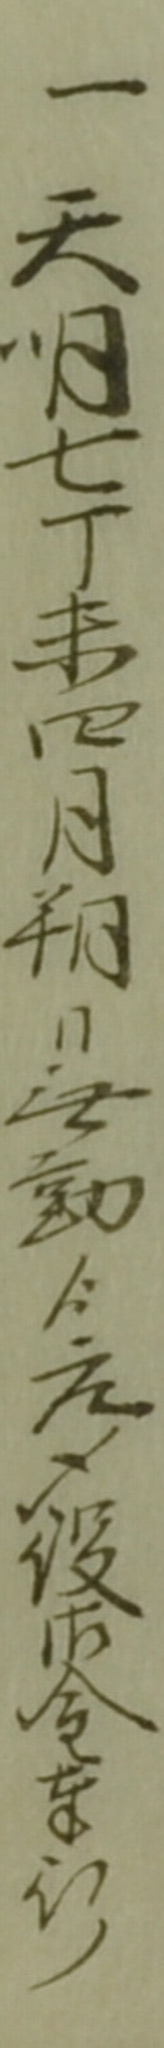一天明七丁未四月朔日無勤ゟ元〆役御金奉行
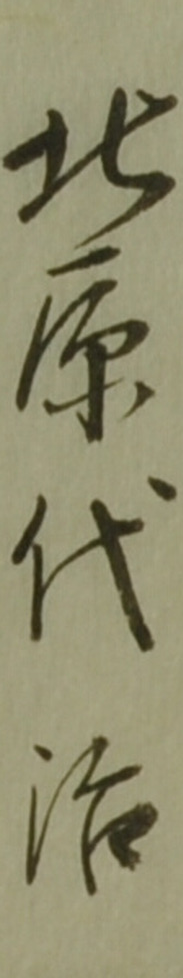北原代治
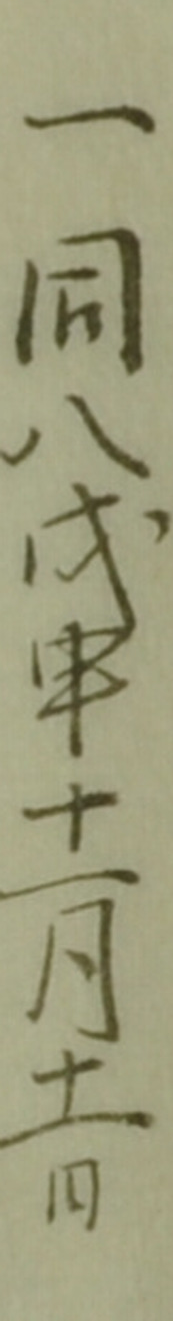一同八戊申十一月十一日
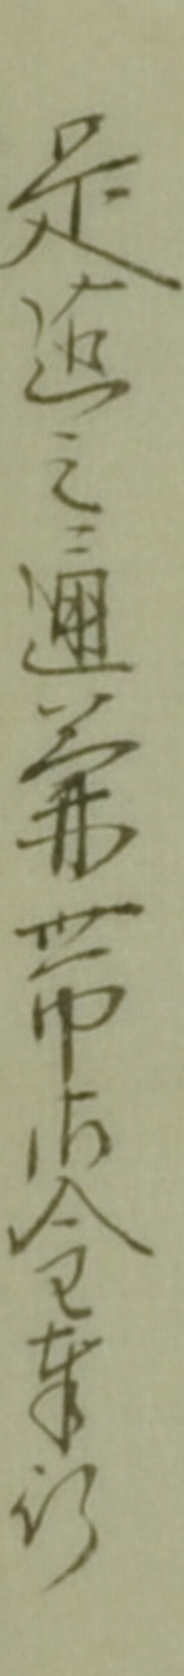是迄之通兼帯御金奉行
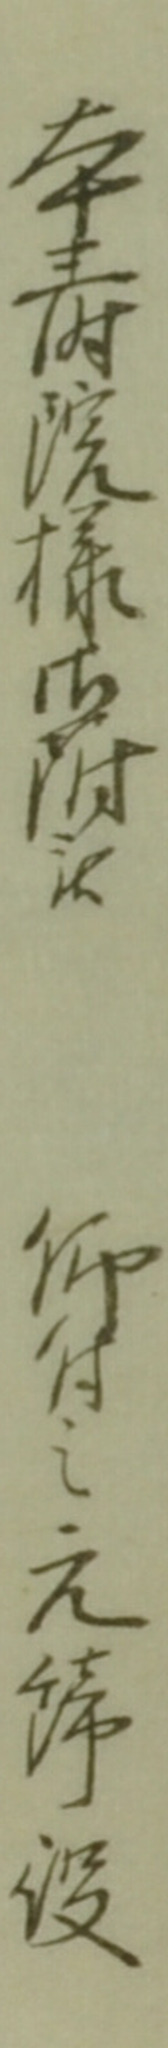本寿院様御附被仰付之元締役
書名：諸御役代々録（七）
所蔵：伊那市立高遠町図書館・合同会社AMANE
